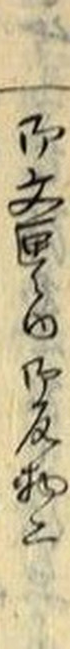御文匣之内御反物二
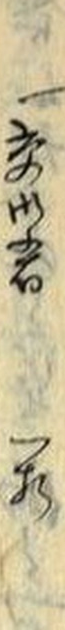交御肴一折
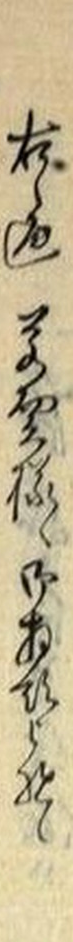右之通若殿様へ御拝領被遊候
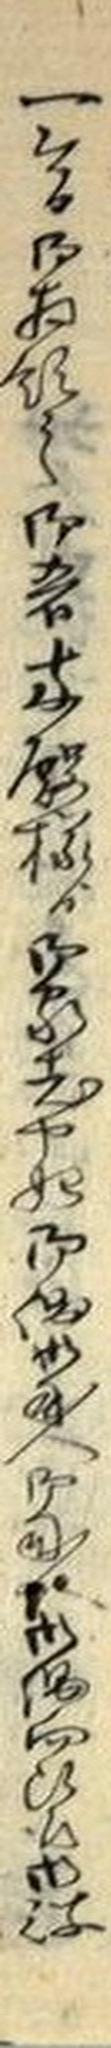一今日御拝領之御肴両殿様ゟ御家老中始御側御用人御用人御側向頭取御役
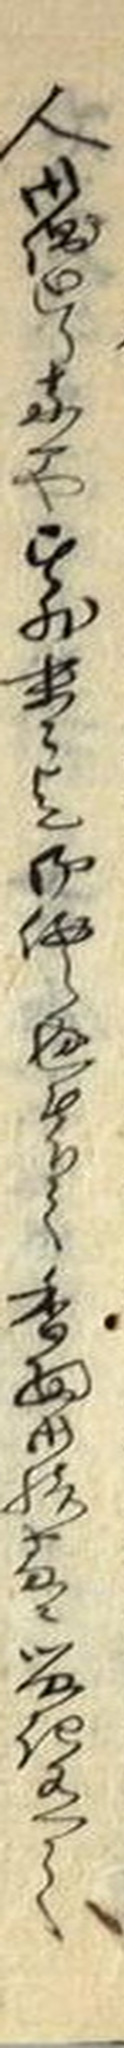人御側廻り両部や其外未々迄御例之通被下之委細御膳番ニ留記有之
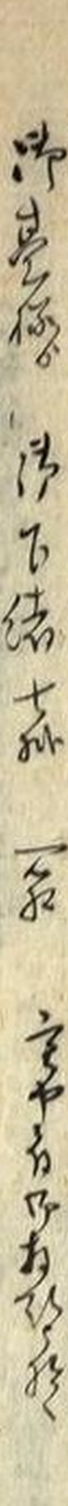御台様ゟ御下緒七掛一箱寒中ニ付御拝領被遊候
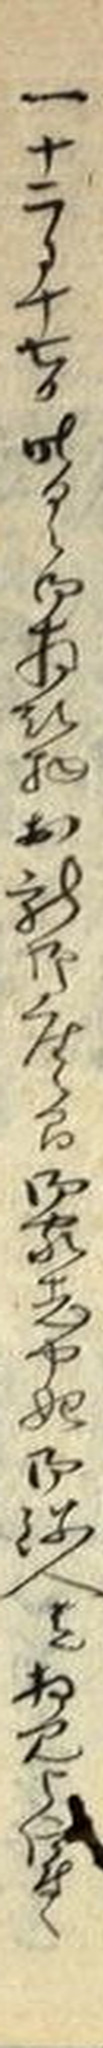一十二月十七日昨日之御拝領物於新御座之間御家老中始御役人迄拝見被仰付候
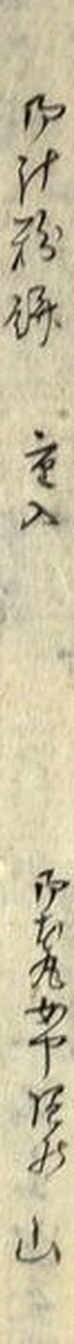御汁粉餅重入御本丸女中隠居山
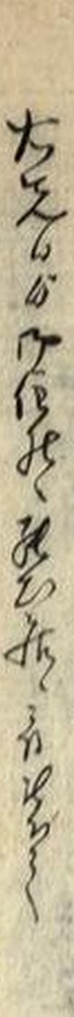右先日ゟ御住居へ罷出居候ニ付被下之
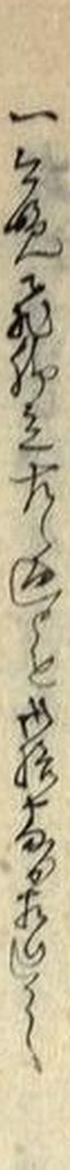一今晩飛脚立左之通被進御膳番ゟ相廻之
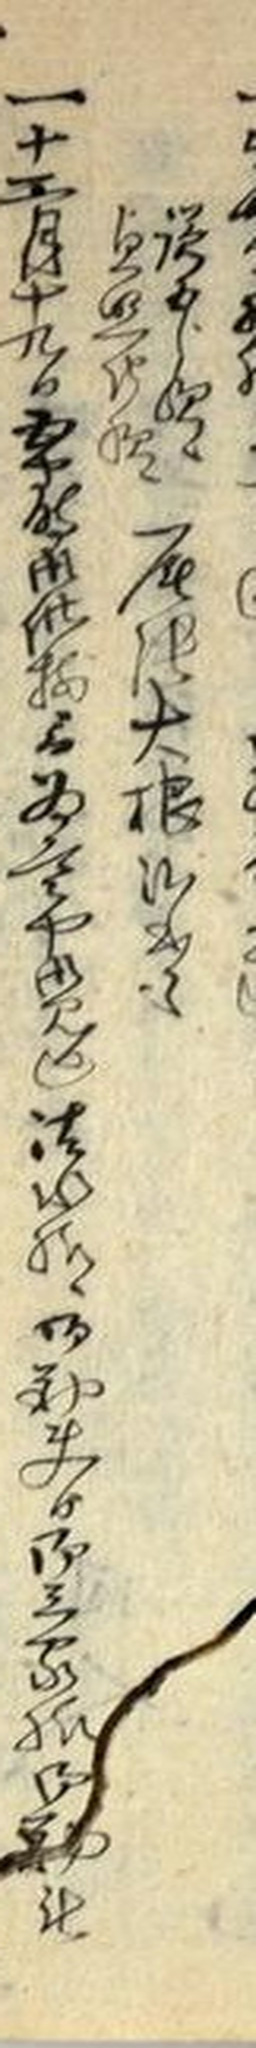一十二月十九日五半時御供揃ニ而為寒中御見廻清水様へ御勤夫ゟ御三家様御勤被
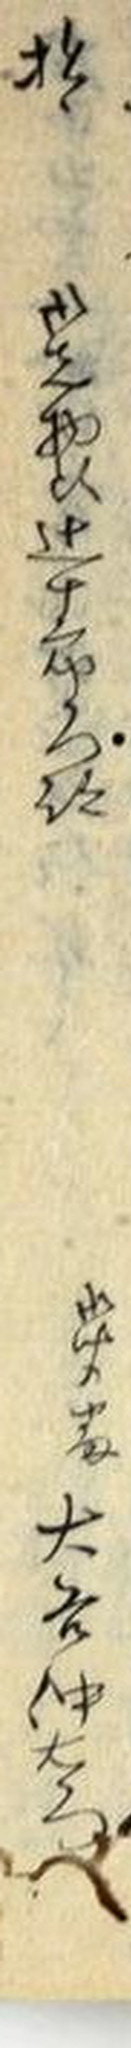遊候御先物頭辻十郎右衛門跡御聞番大谷仲右衛門

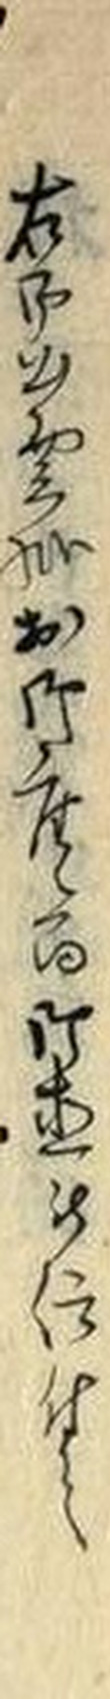右御出殿掛於御座之間御直被仰付之
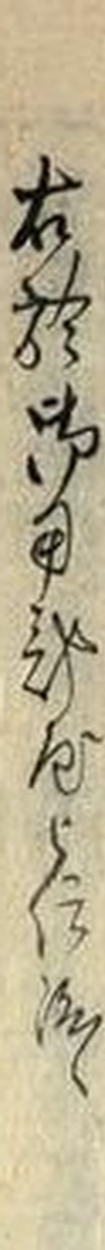右於御用部屋被仰渡候
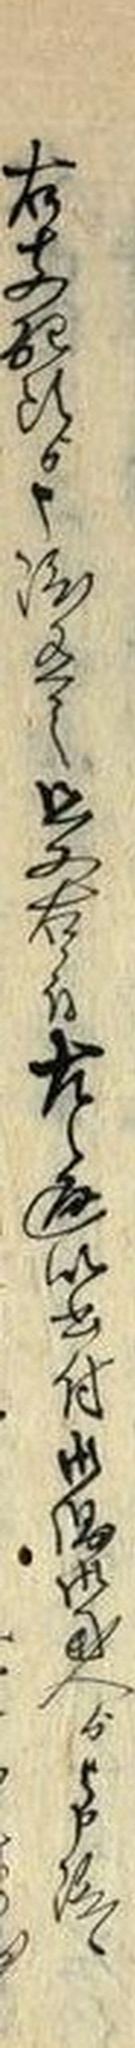右支配頭ゟ申渡有之且又右ニ付左之通以書付御側御用人ゟ被申渡候
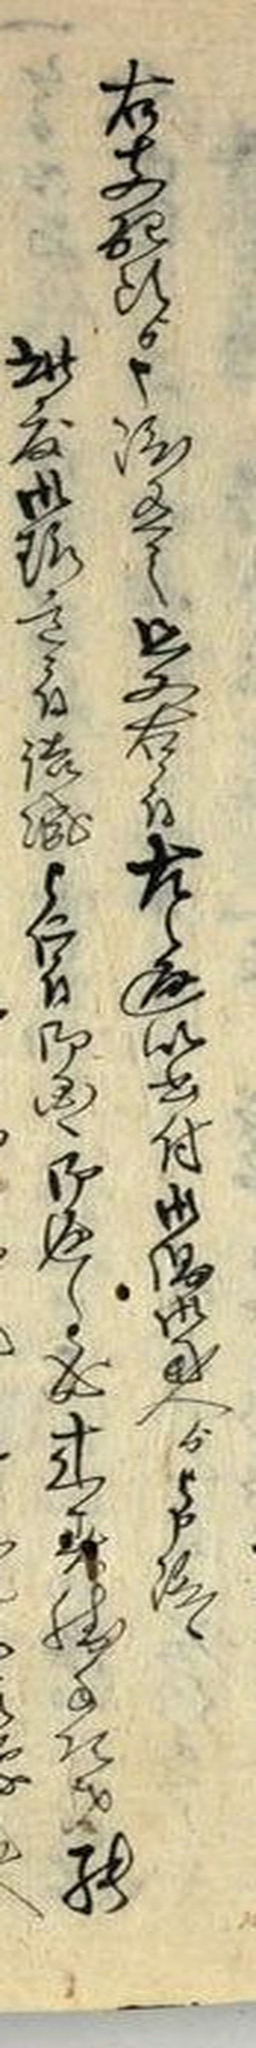此度御趣意ニ付諸減被仰付御国へ御返し被成来春勝手次第罷
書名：少傅日録抄（斉承付側向頭取日記、在府）
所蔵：福井県文書館 Fukui Prefectural Archives
